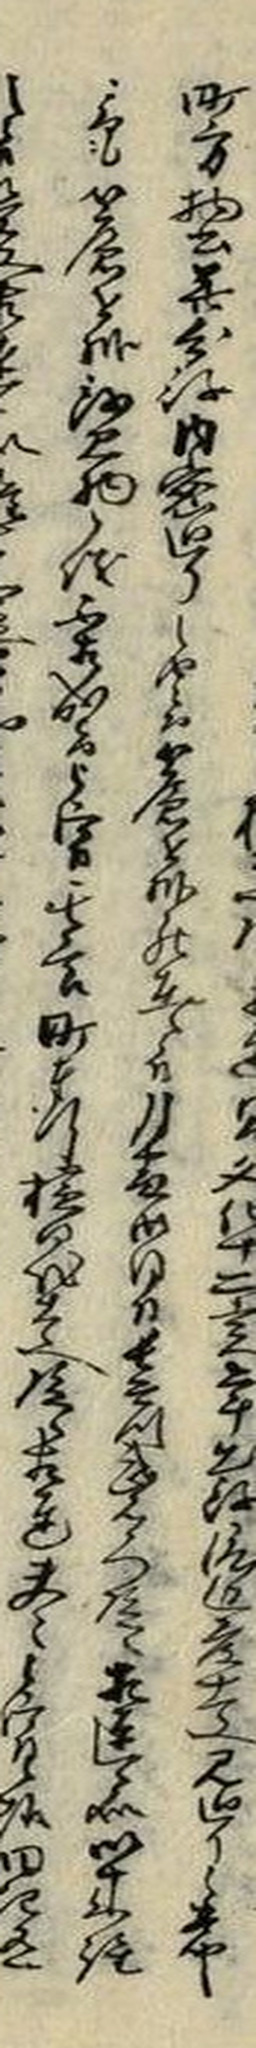にても簾を掛致見物候儀不相成旨被仰付其節町奉行横田作大夫殿へ相達夫々被仰付候趣旧記有
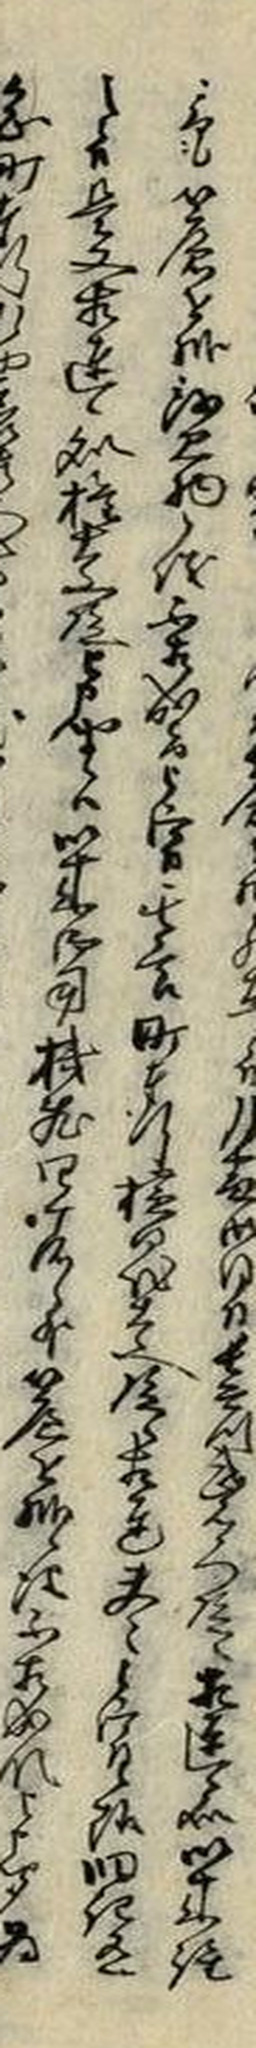之に付是又相達候処権大夫殿被申聞候は以来御用桟敷四ケ所之外簾を掛候儀不相成段被申聞為
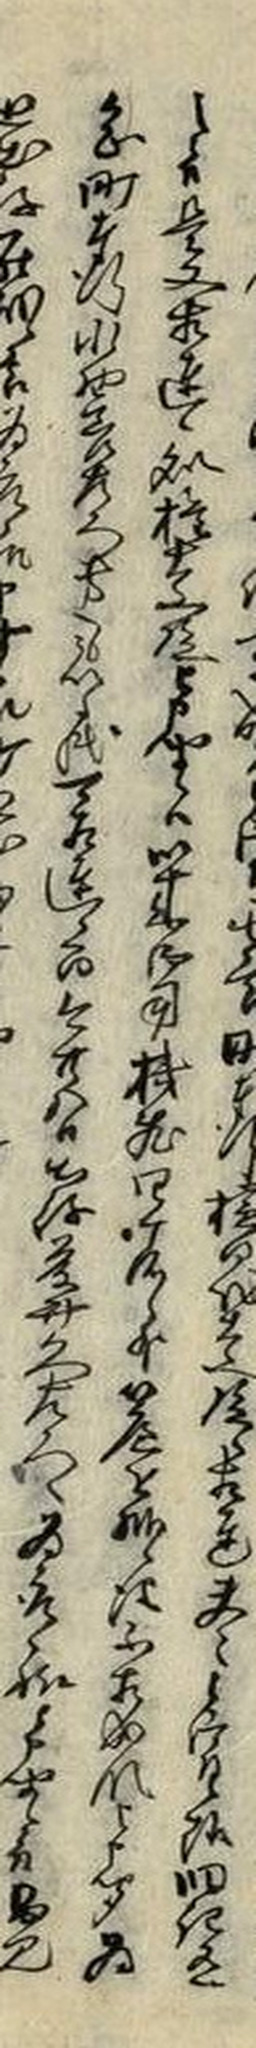念町奉行水野善左衛門方へも以手紙可相達候間今廿八日出役藤井久左衛門へ為取候様被申聞候に付則見
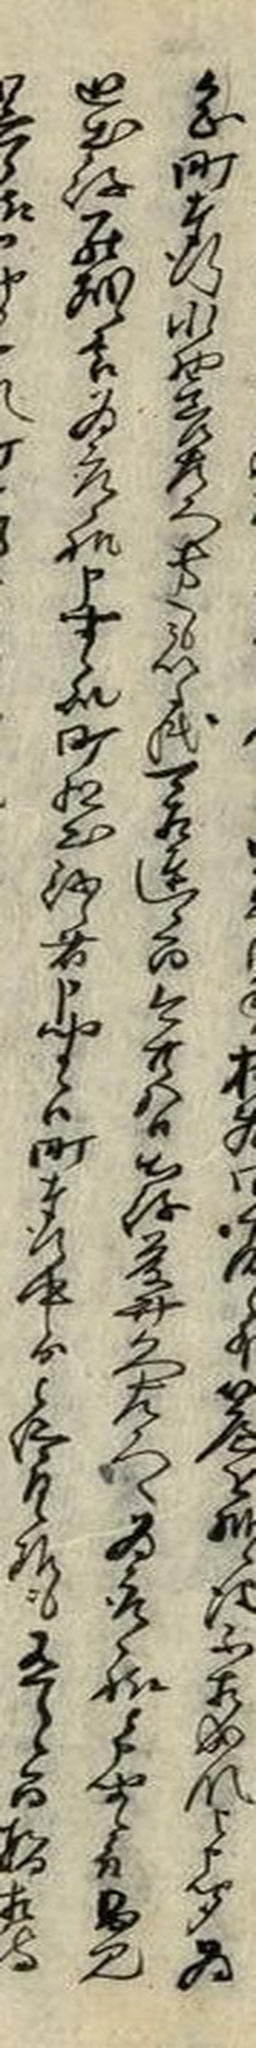廻出役罷越候節為取候様申聞候処町組出役之者申聞候は町奉行中ゟ被仰付候趣も有之候間暫相待
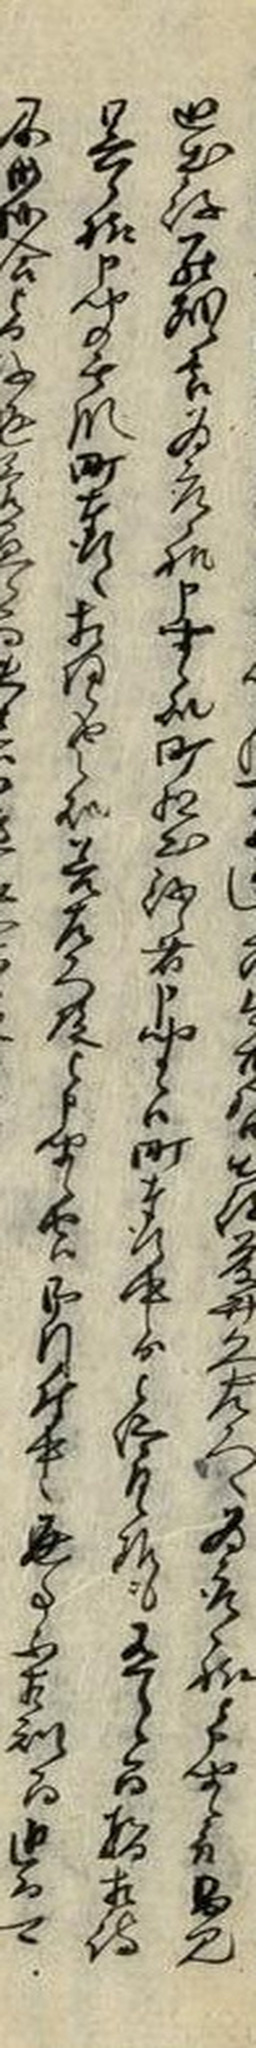呉候様申聞其段町奉行へ相伺候由之処善左衛門殿被申聞候由は御目付中之返事不相知候間追て可
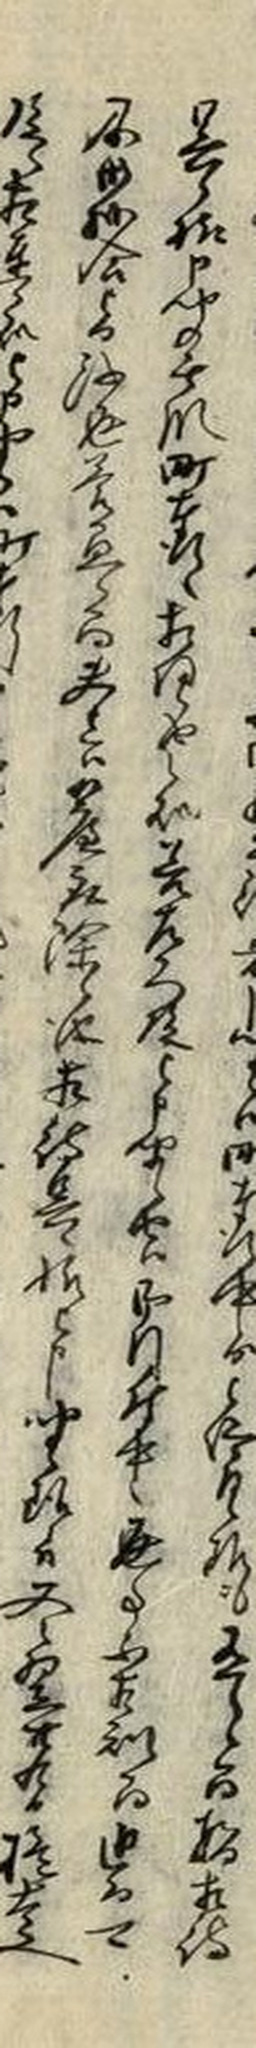及御掛合旨致返答置候間夫迄は簾取除候儀相待呉候様被申聞候趣に付又々翌廿九日権大夫
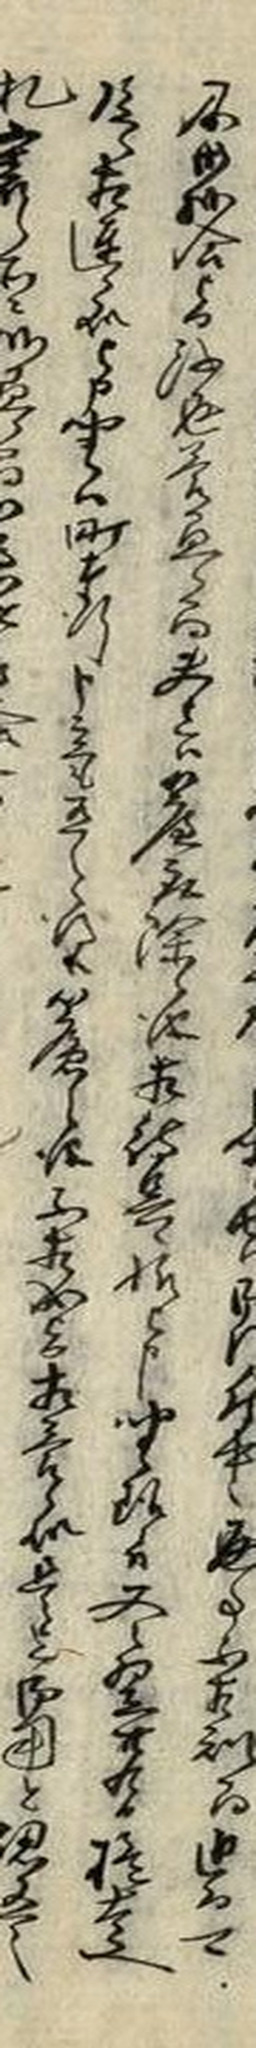殿へ相達候処被申聞候は町奉行申立も有之候得共簾之儀不相成旨相答候処是迄御用と認有之
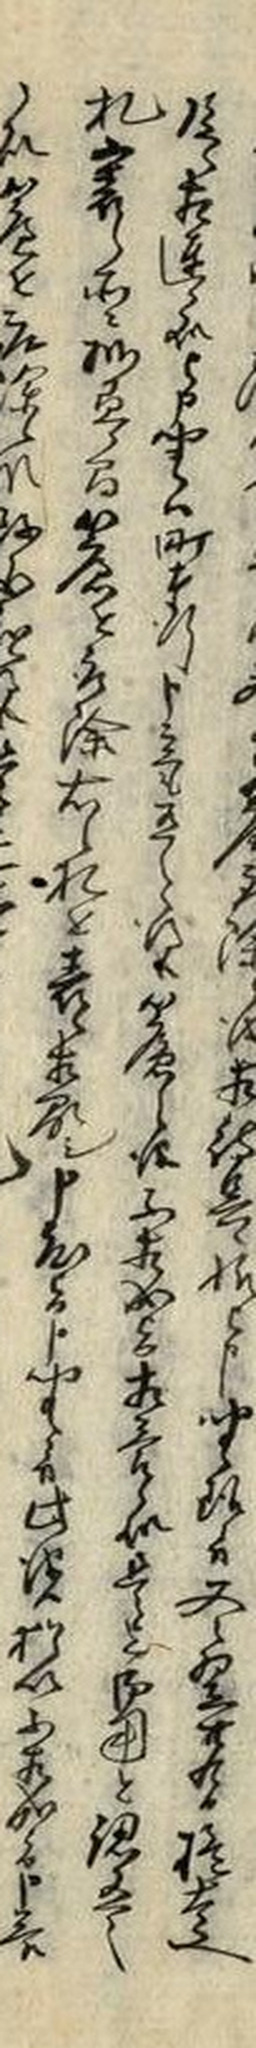札裏之所に掛置候間簾を取除右之札を表へ相顕シ申度旨申聞候に付此儀は猶以不相成旨申答
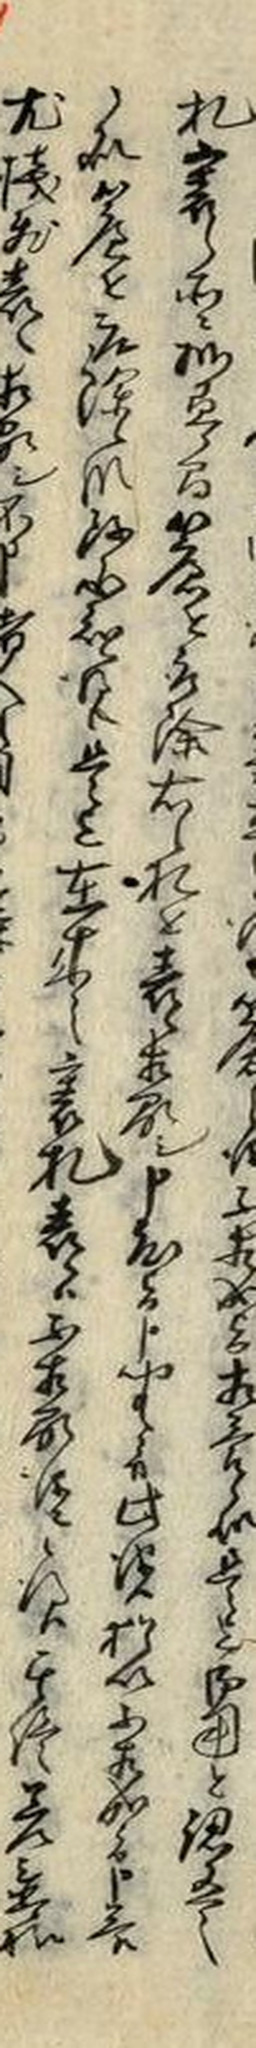候処簾を取除候段致承知候得共是迄在来之裏札表へは不相顕儀に候得は其儘差置候様
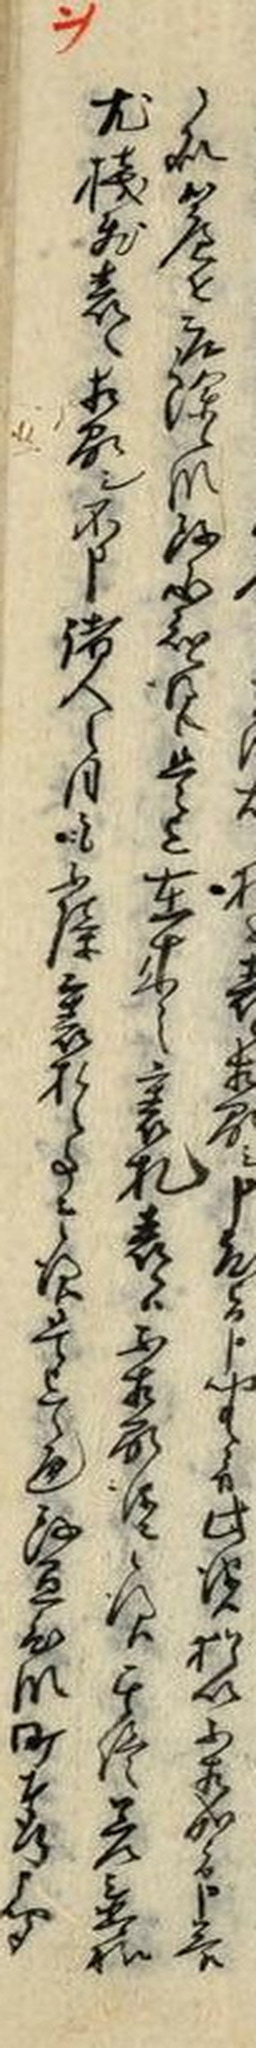尤桟敷表へ相顕シ不申諸人之目にも不障裏札之事に候得は是迄之通致置度段町奉行申聞

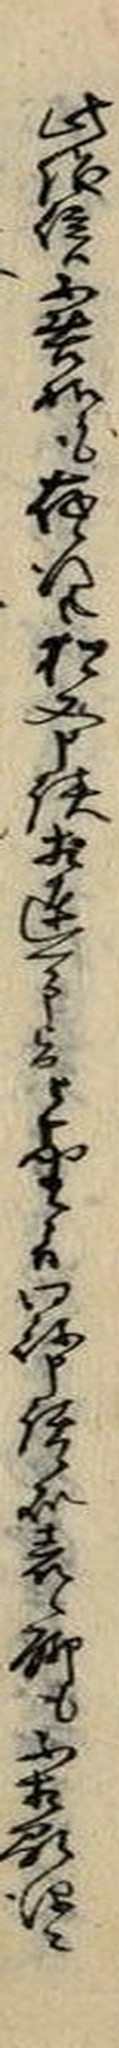此儀位は不苦様にも存候得共猶又申談相達可申旨被申聞候に付同役申談候処表へ聊も不相顕儀に
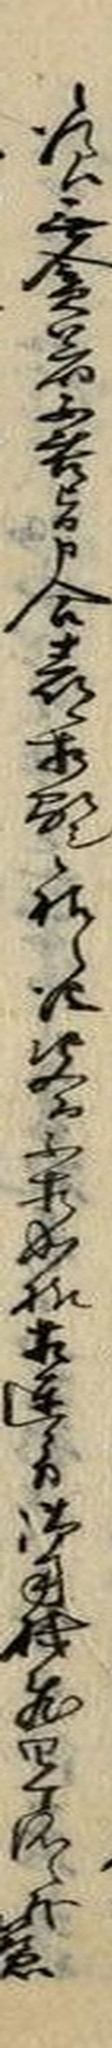候得は無貪着不苦旨申合表へ相顕シ候様之儀決て不相成様相達候に付御用桟敷四ケ所之外簾
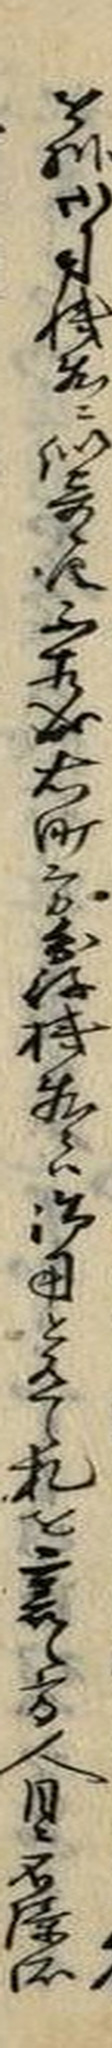を掛御用桟敷に似寄候儀不相成右町方分役桟敷には御用と有之札を裏之方人目に不障所
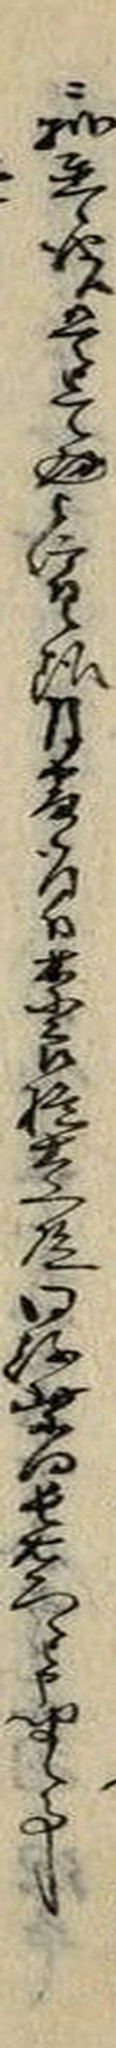に掛置候儀は是迄之通被仰付候趣月番御目付奈良権大夫殿同役柴田長右衛門へ被申聞候事
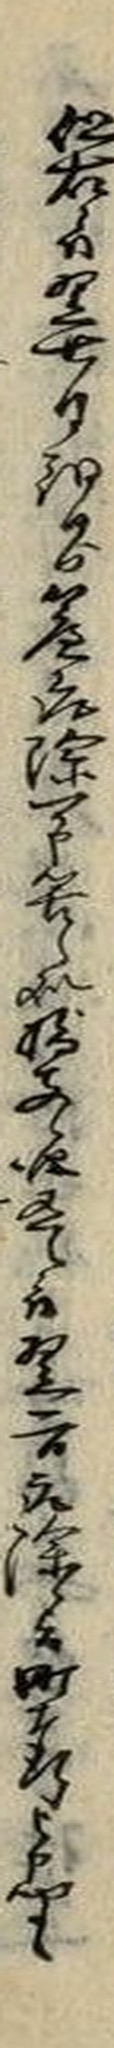但右に付翌七月朔日ゟ簾取除可申筈之処指支候儀有之に付翌二日取除候旨町奉行被申聞候
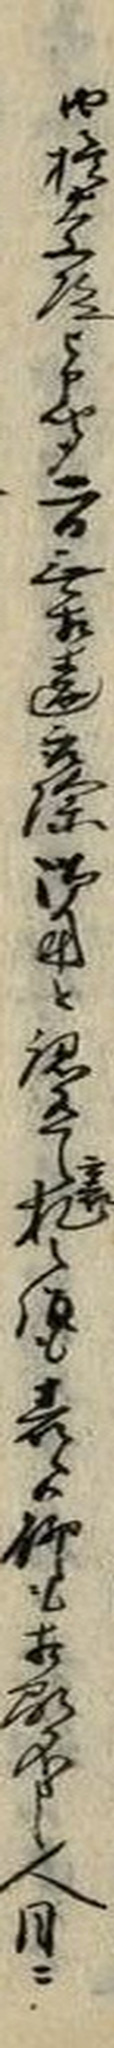由権大夫殿被申聞二日無相違取除御用と認有之裏札之儀も表へは聊も相顕不申人目に
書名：御城下諸事之部
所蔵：福井県文書館 Fukui Prefectural Archives
